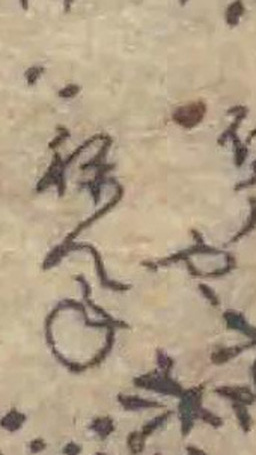ねんね
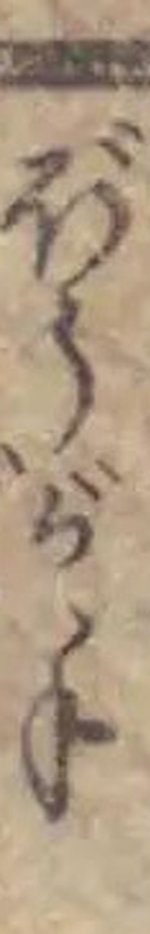ぼうがね
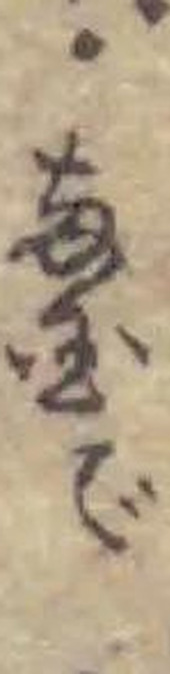両国で
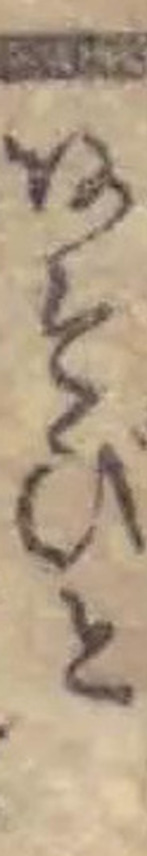あそびと
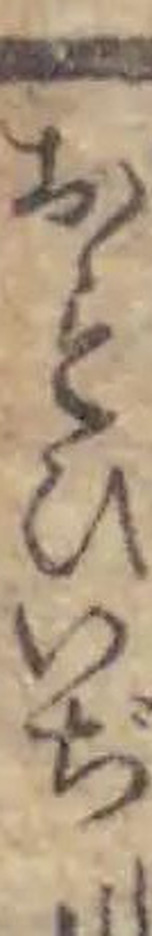おもひいぢ
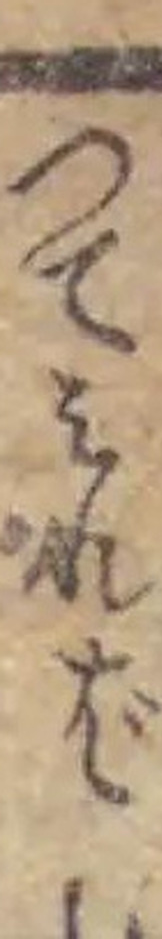つてミれば
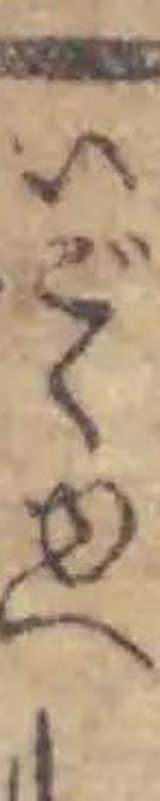いごくゆへ
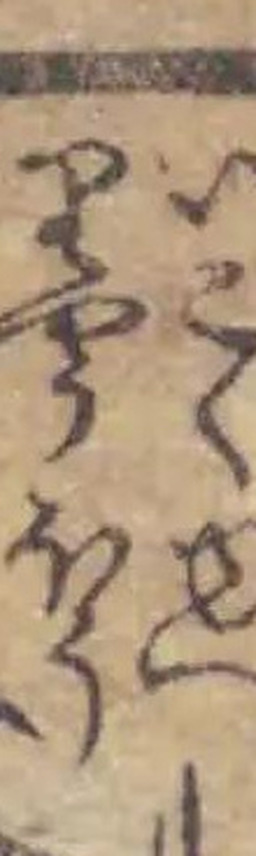りやうほう
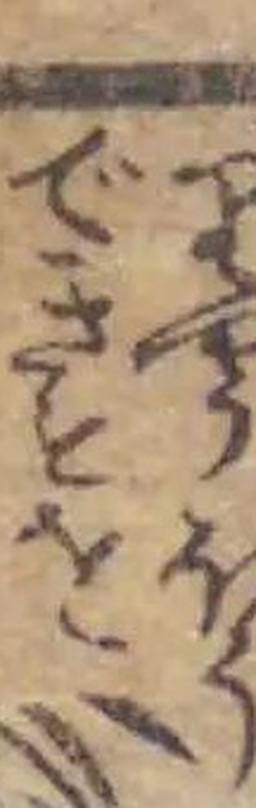できもを
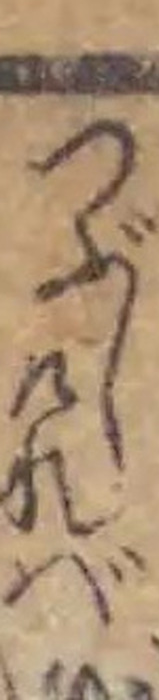つぶしけれバ
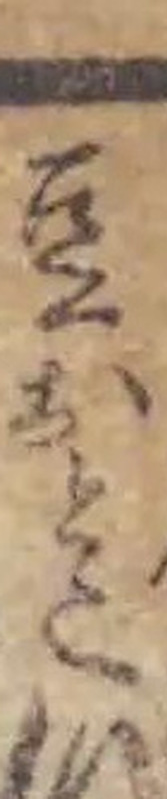豆おとこ
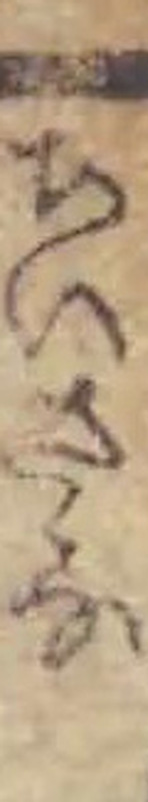ちいさな
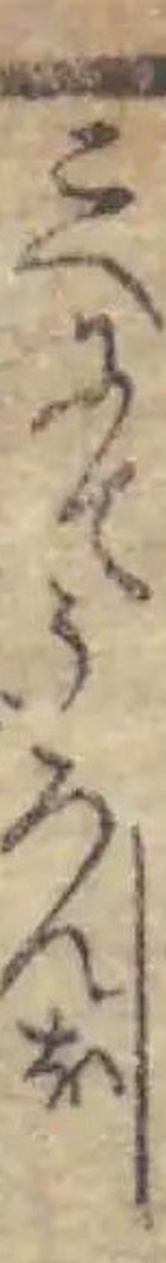こへにてうろんな
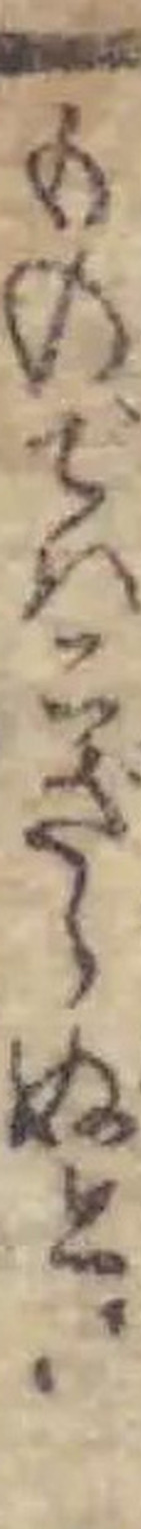ものでハこざらぬと
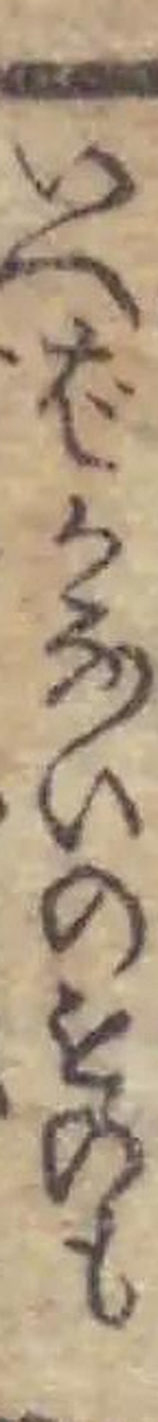いへばかないのものも
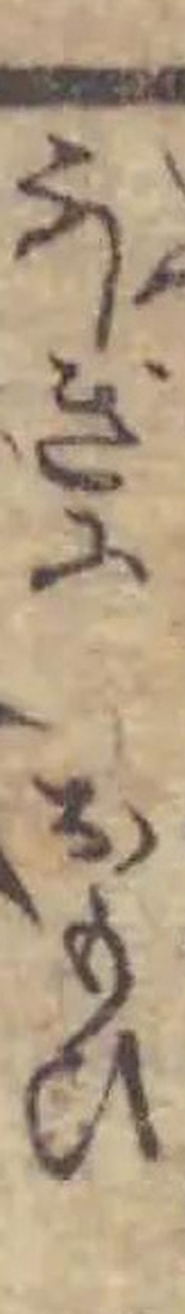ふしぎにおもひ
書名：豆男江戸見物 2巻
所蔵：国立国会図書館 National Diet Library, JAPAN
